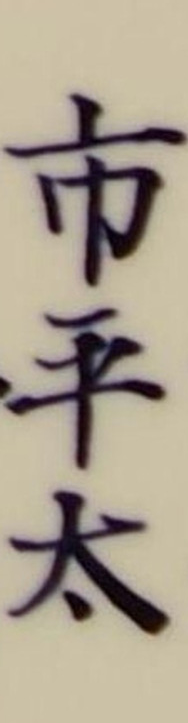市平太
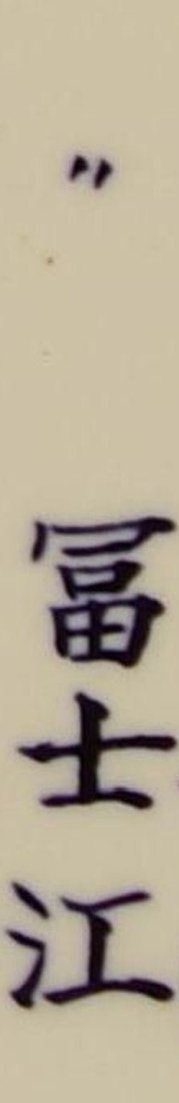冨士江
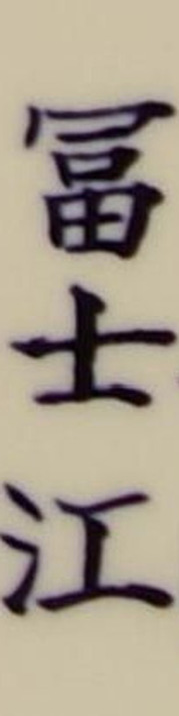冨士江
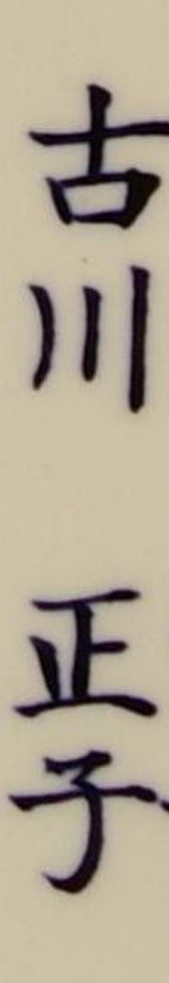古川正子
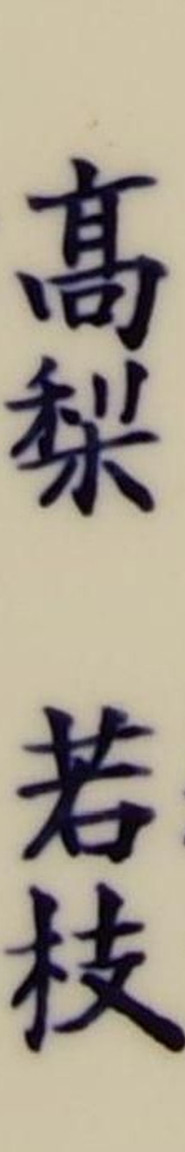高梨若枝
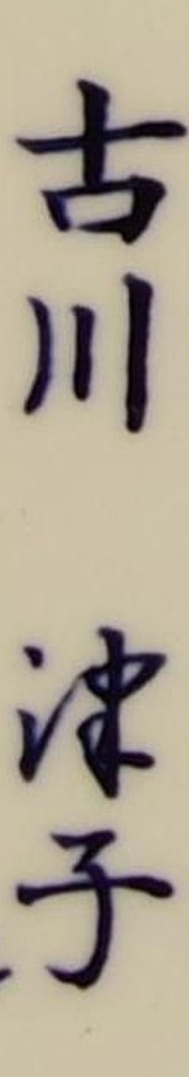古川津子
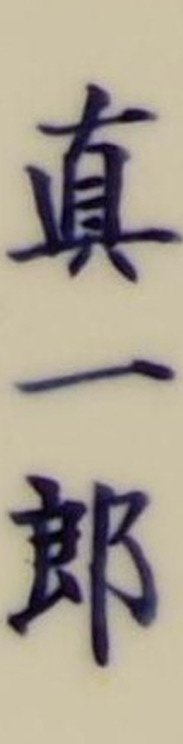真一郎
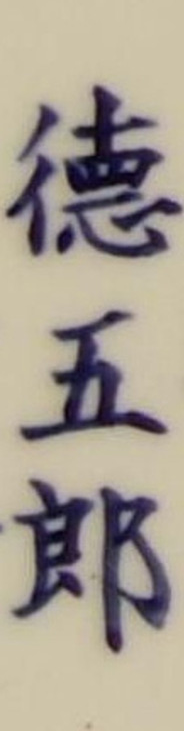徳五郎

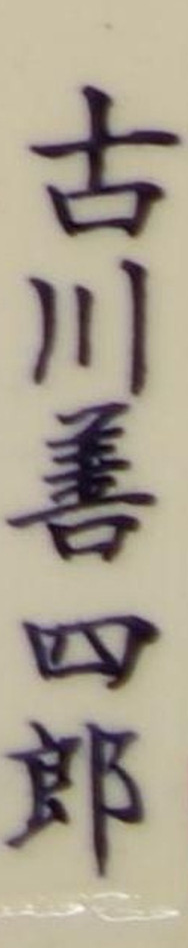古川善四郎
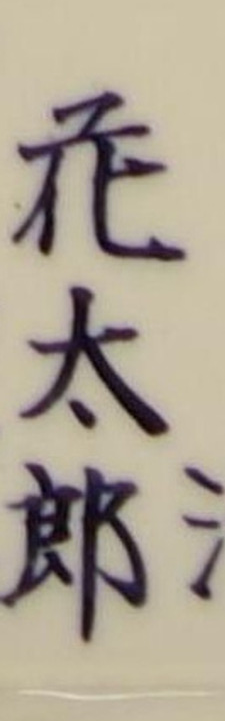花太郎
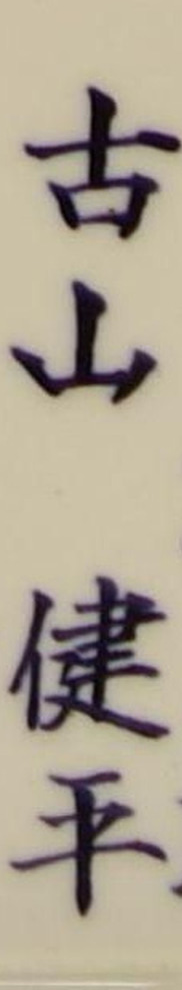古山健平
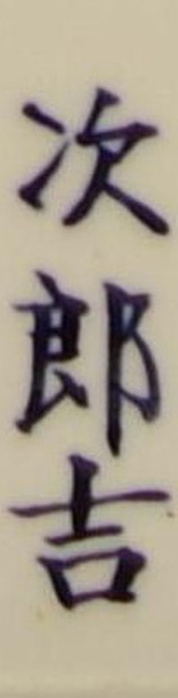次郎吉
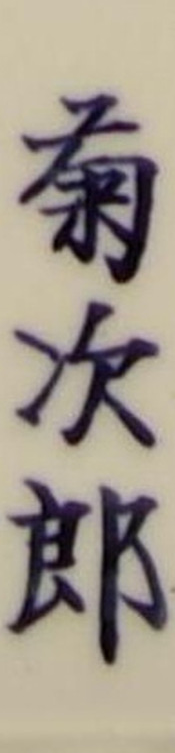菊次郎
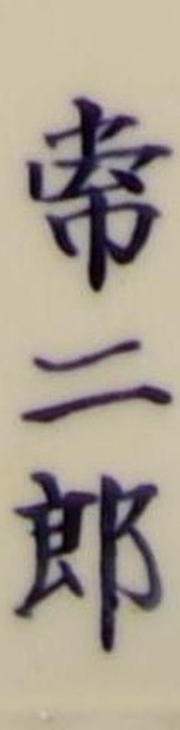常二郎
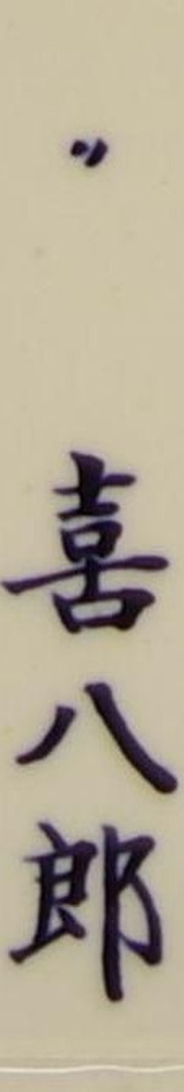喜八郎
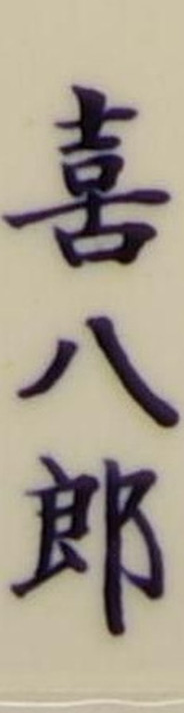喜八郎
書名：E~L
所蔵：高野山金剛峯寺
